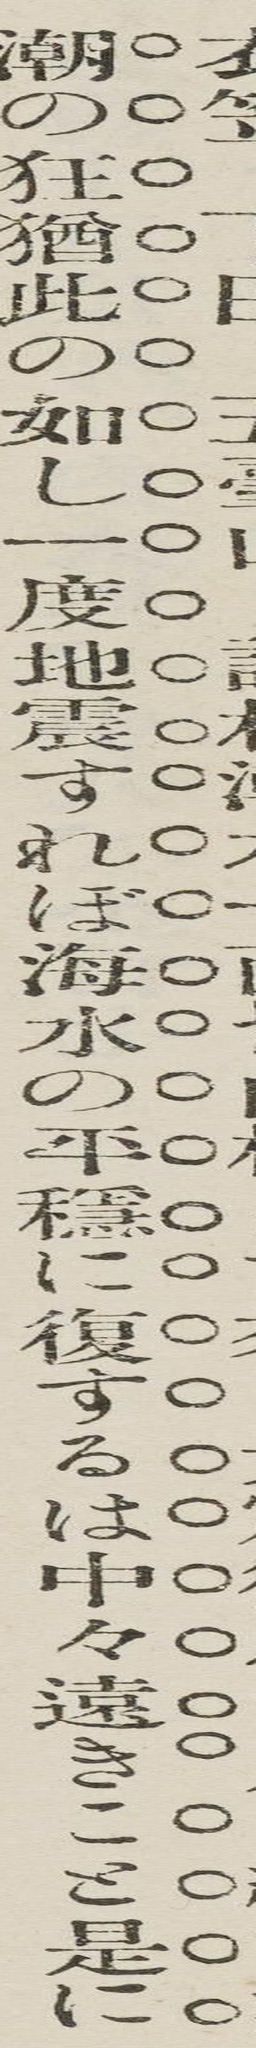潮の狂猶此の如し一度地震すれば海水の平穏に復するは中々遠きこと是に
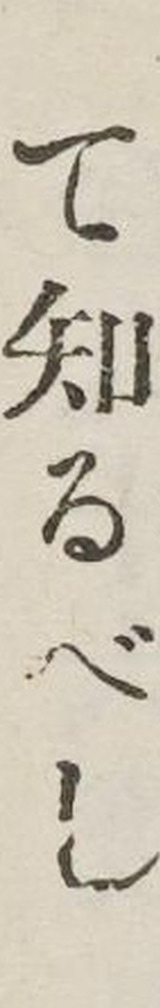て知るべし
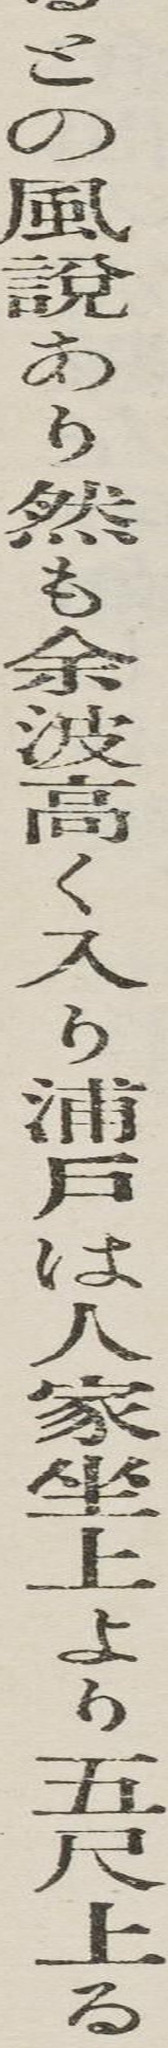るとの風説あり然も余波高く入り浦戸は人家坐上より五尺上る
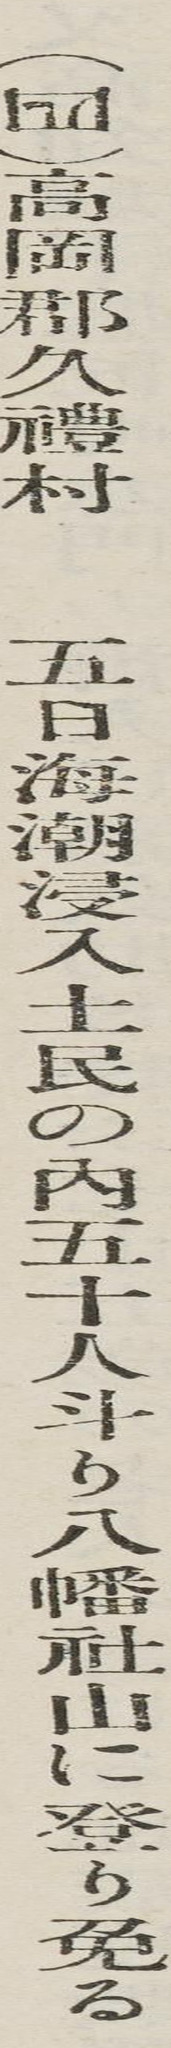㈣高岡郡久礼村五日海潮浸入土民の内五十人斗り八幡社山に登り免る
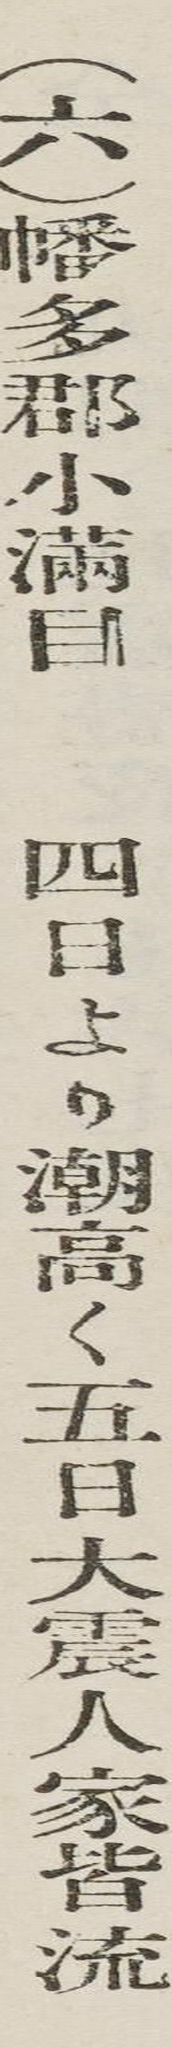㈥幡多郡小満目四日より潮高く五日大震人家皆流
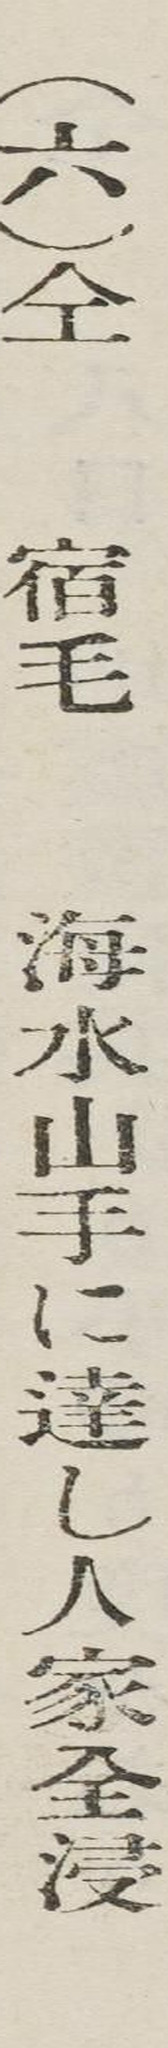㈥仝宿毛海水山手に達し人家全浸
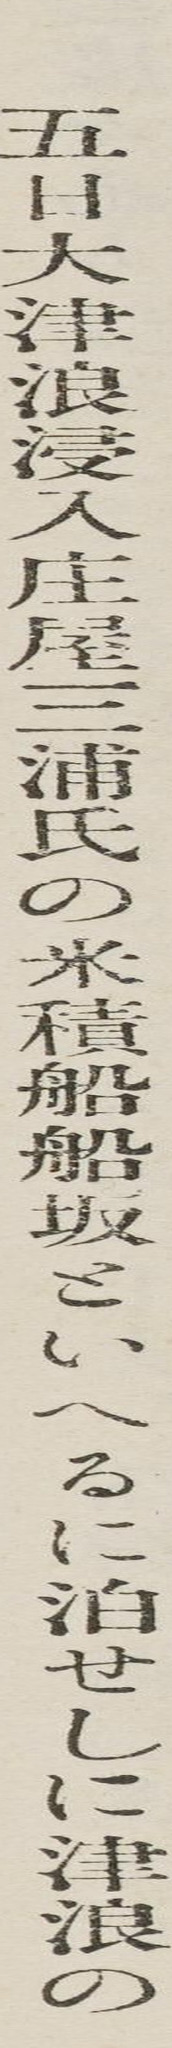㈦仝沖島五日大津浪浸入庄屋三浦氏の米積船船坂といへるに泊せしに津浪の
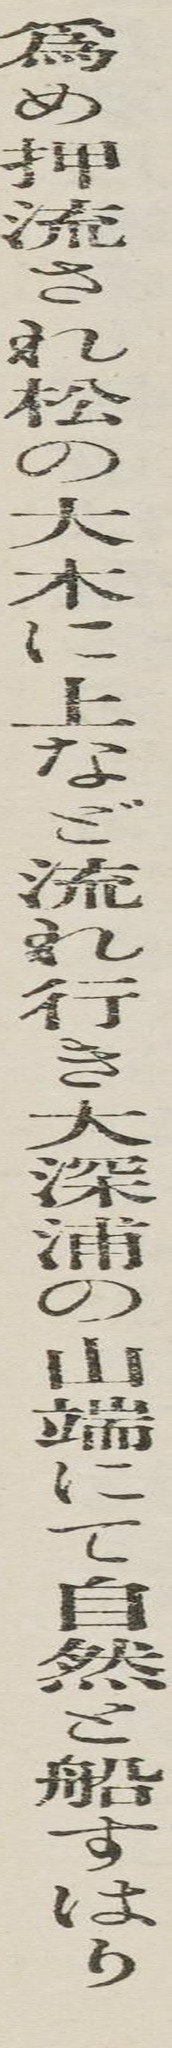為め押流され松の大木に上など流れ行き大深浦の山端にて自然と船すはり
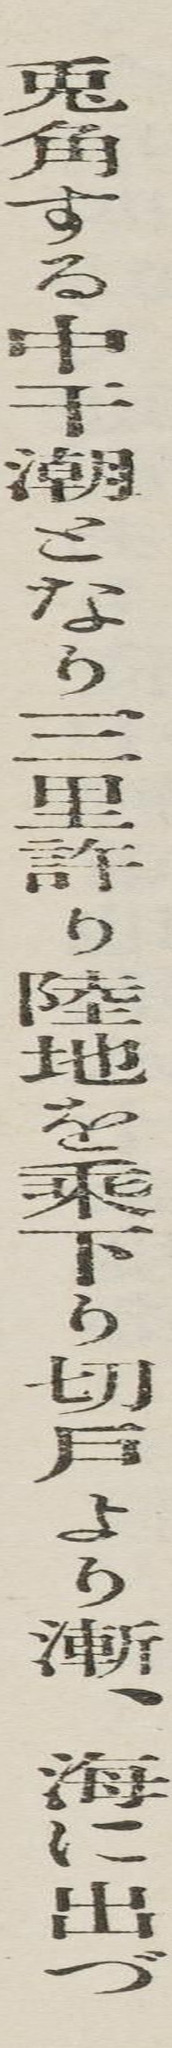兎角する中干潮となり三里許り陸地を乗下り切戸より漸、海に出づ
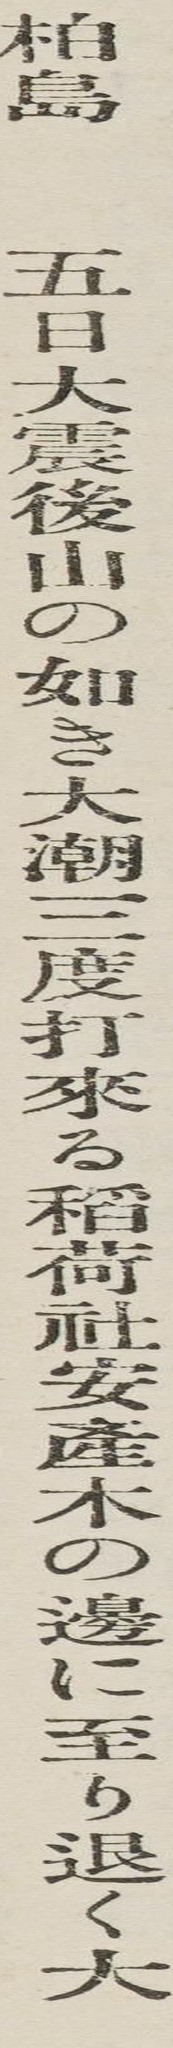㈧仝柏島五日大震後山の如き大潮三度打来る稲荷社安産木の辺に至り退く大
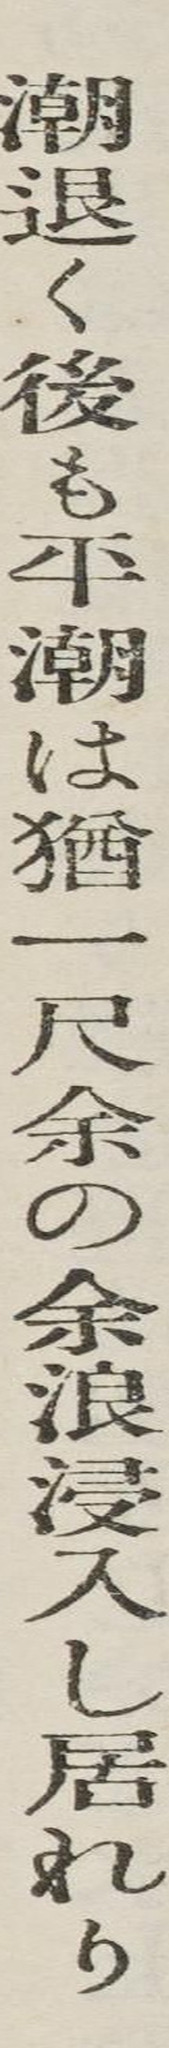潮退く後も平潮は猶一尺余の余浪浸入し居れり
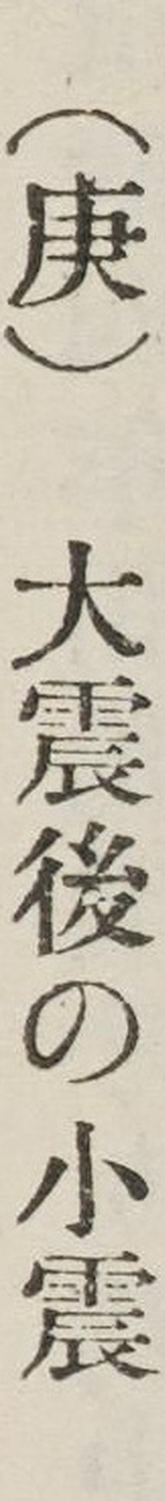大震後の小震
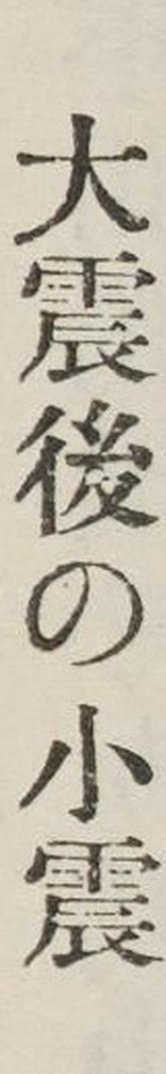大震後の小震

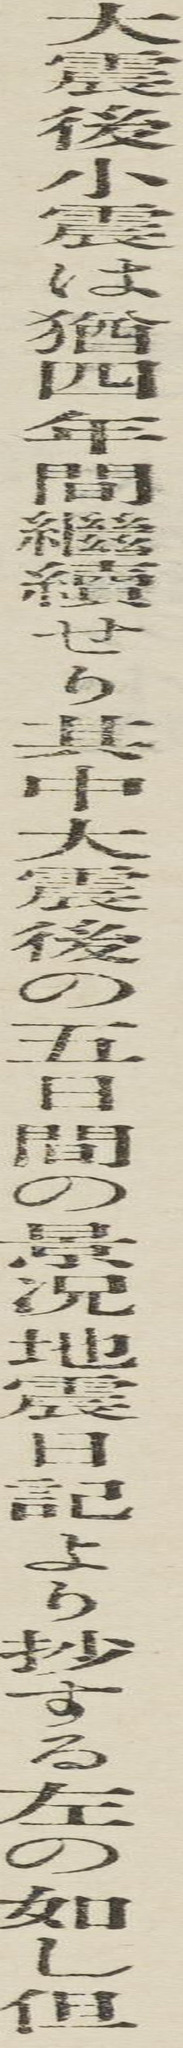大震後小震は猶四年間継続せり其中大震後の五日間の景况地震日記より抄する左の如し但
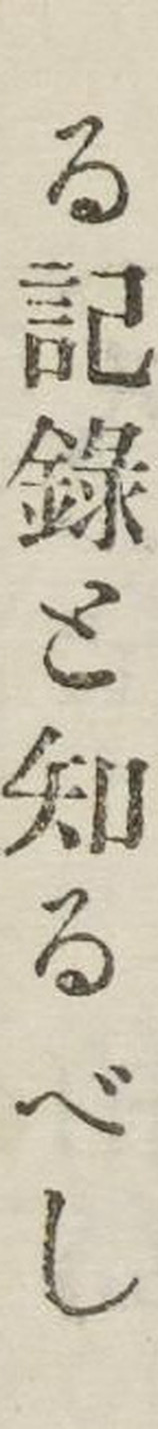る記録と知るべし
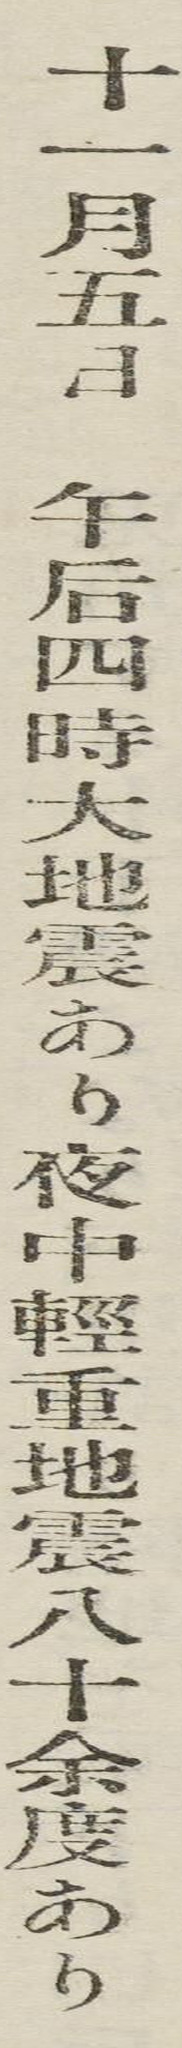十一月五日午后四時大地震あり夜中軽重地震八十余度あり
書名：土佐古今ノ地震
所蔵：東京大学地震研究所図書室 Earthquake Research Institute Library, The University of Tokyo, JAPAN
